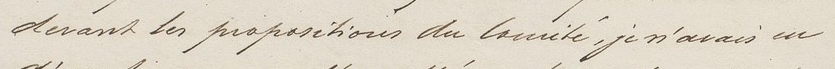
devant les propositions du Comité, je n'avais eu
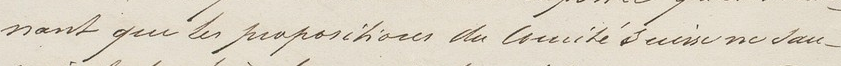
nant que les propositions du Comité suisse ne sau-
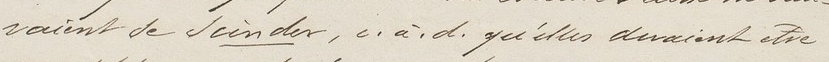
vaient se scinder, c. à. d. qu'elles devaient être
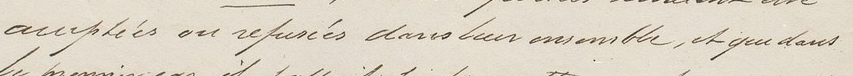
acceptées ou refusées dans leur ensemble, et que dans
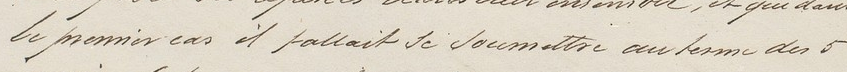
le premier cas il fallait se soumettre au terme des 5
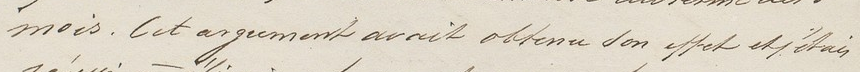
mois. Cet argument avait obtenu son effet et j'étais
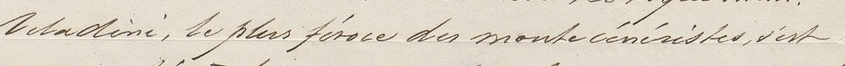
Veladini, le plus féroce des Monte Cénéristes, s'est
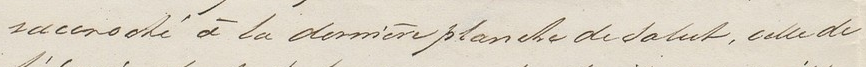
raccroché à la dernière planche de salut, celle de
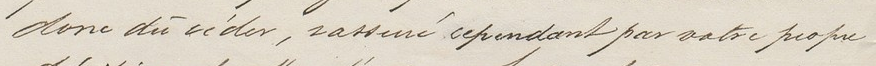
donc dû céder, rassuré cependant par votre propre
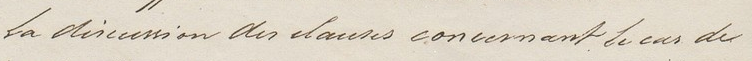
La discussion des clauses concernant le cas de
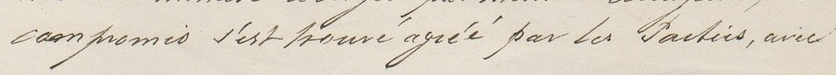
compromis s'est trouvé agréé par les Parties, avec
